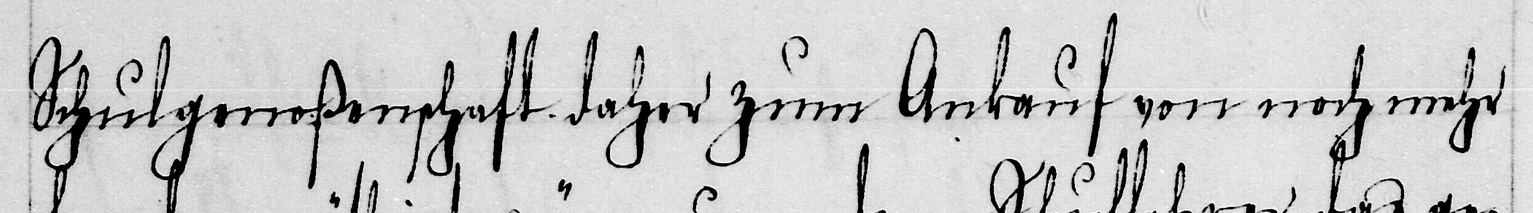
Schulgenoßenschaft daher zum Ankauf von noch mehr
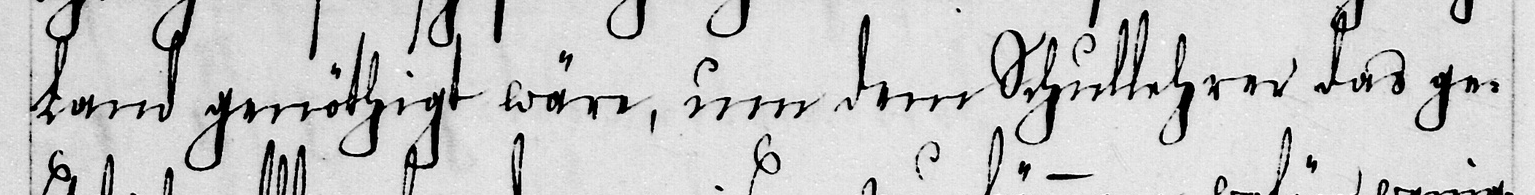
Land genöthigt wäre, um dem Schullehrer das ge¬
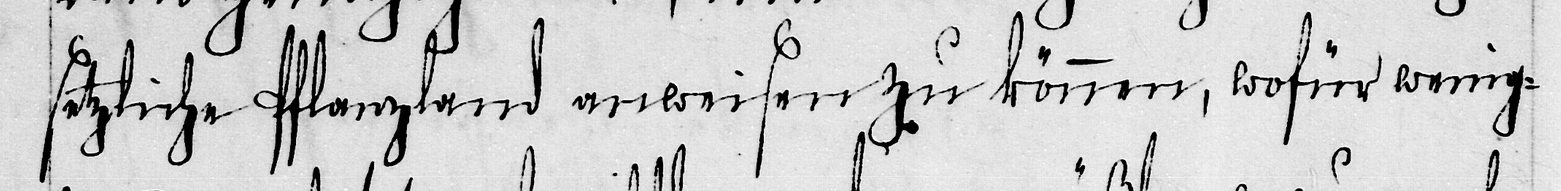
setzliche Pflanzland anweisen zu können, wofür wenig¬
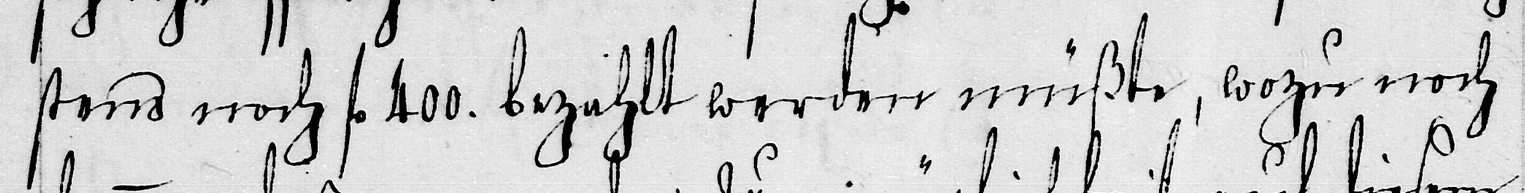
stens noch fl. 400. bezahlt werden müßte, wozu noch
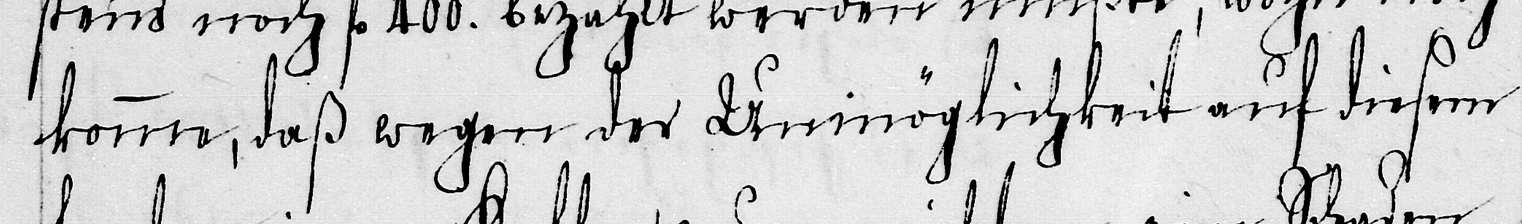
komme, daß wegen der Unmöglichkeit auf diesem
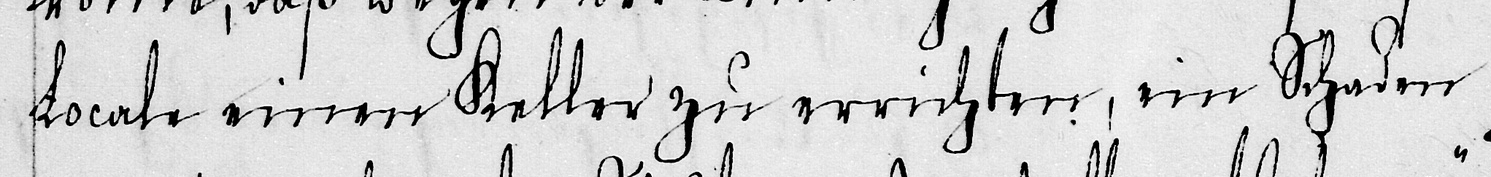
Locale einen Keller zu errichten, ein Schaden
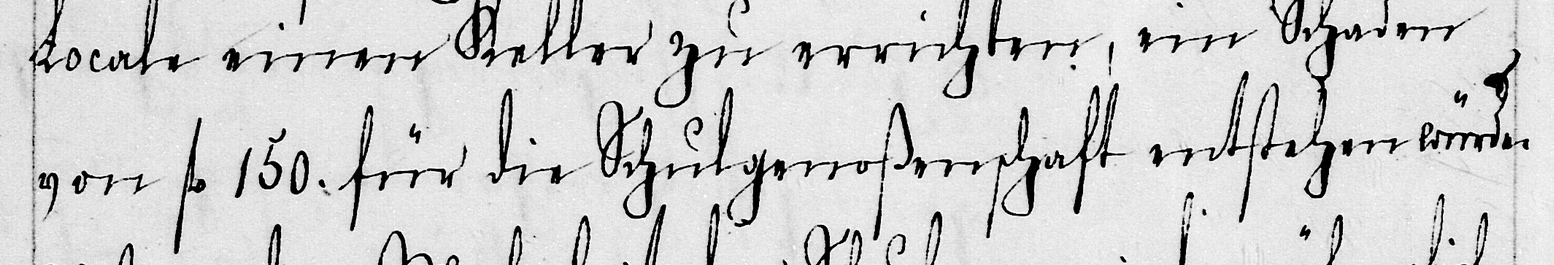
von fl. 150. für die Schulgenoßenschaft entstehen würde.
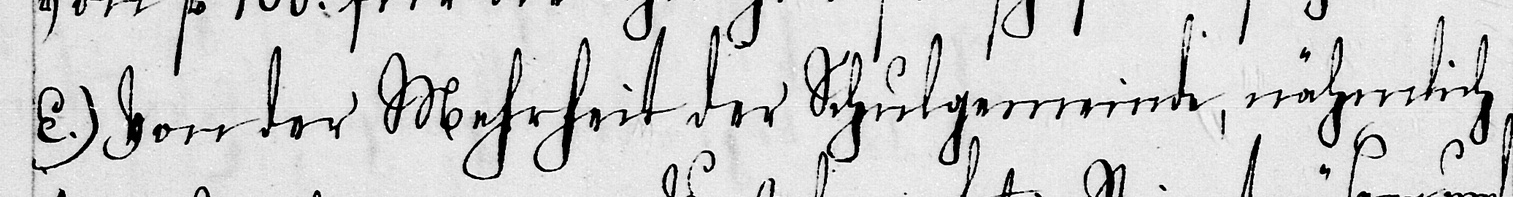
E.) Von der Mehrheit der Schulgemeinde, nähmlich
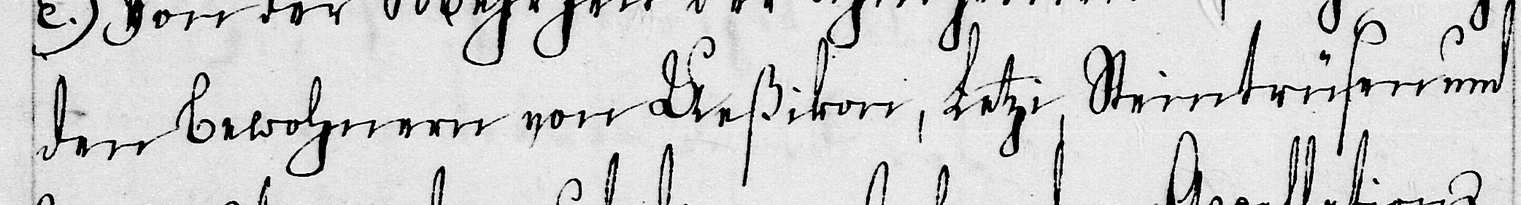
den Bewohnern von Ueßikon, Letzi, Steintrüsen und
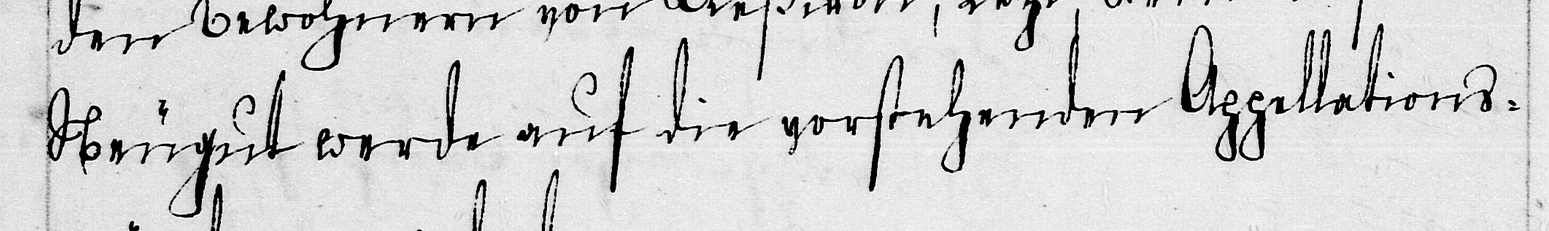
Neugut werde auf die vorstehenden Appellations¬
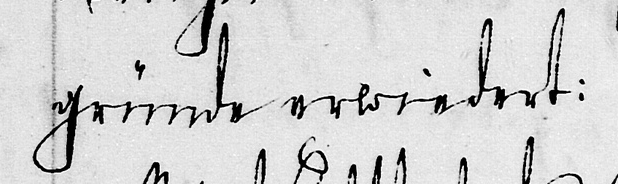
gründe erwiedert:
